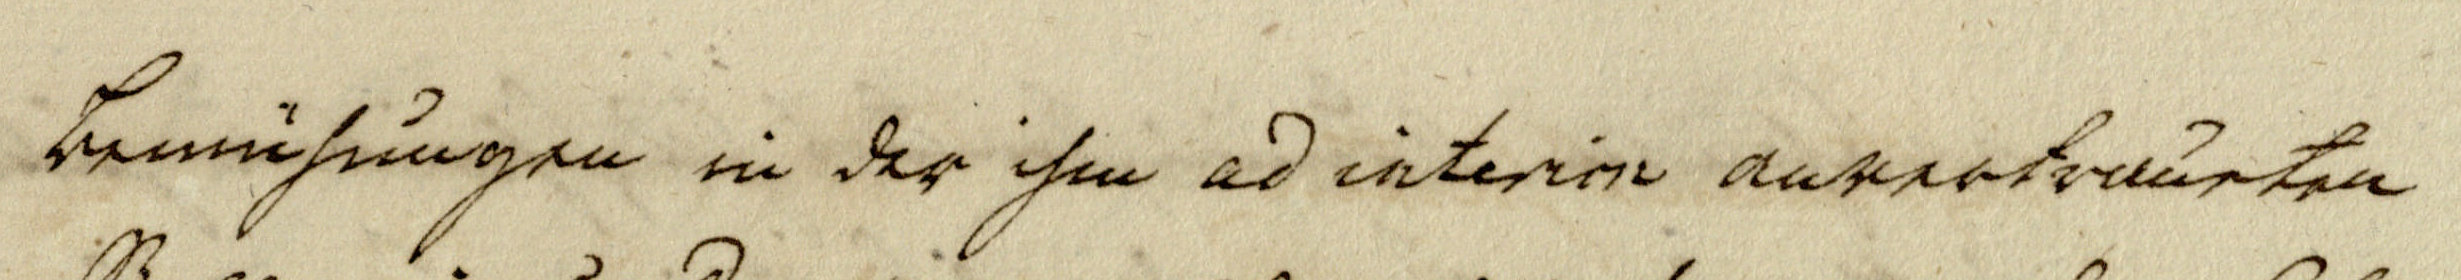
Bemühungen in der ihm ad interim anvertraueten
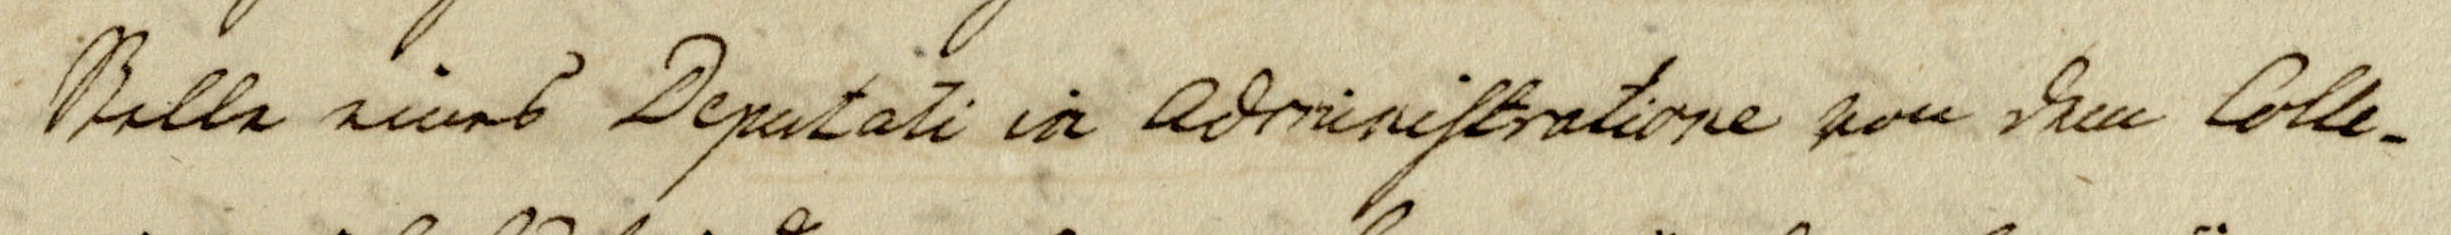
Stelle eines Deputati in Administratione von dem Colle¬
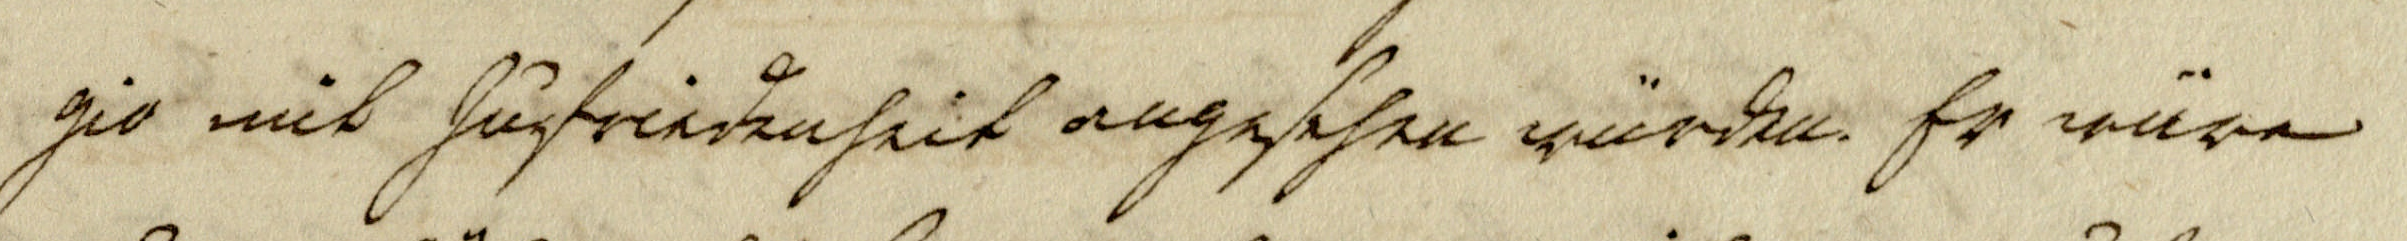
gio mit Zufriedenheit angesehen würden. Er wäre
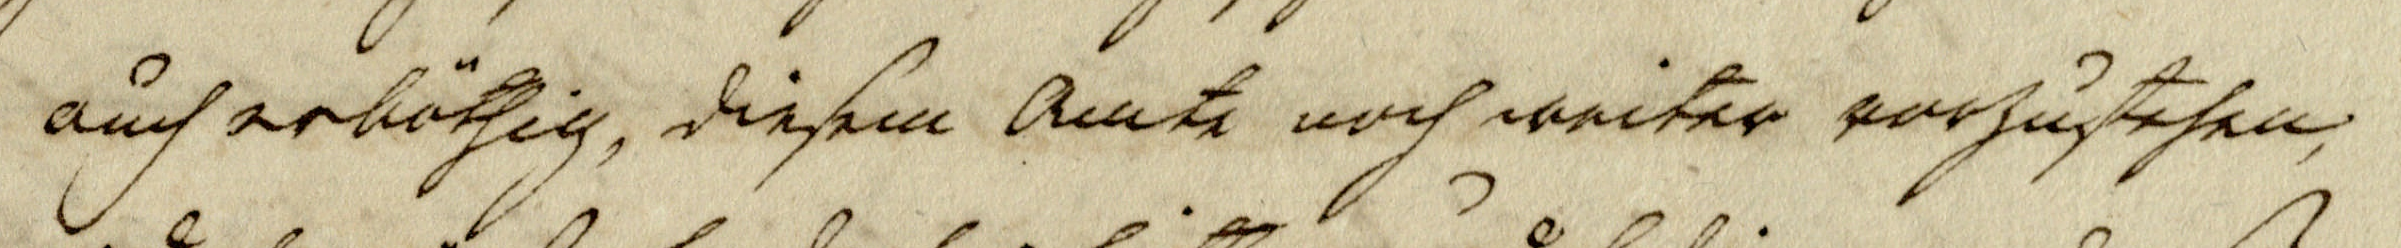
auch erböthig, diesem Amte noch weiter vorzusehen,
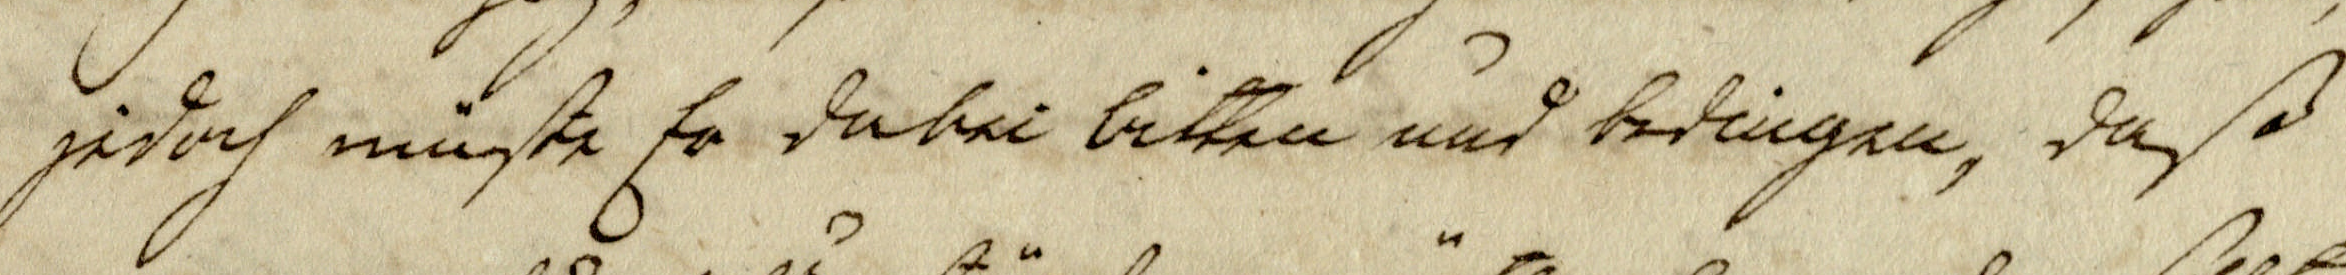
jedoch müßte Er dabei bitten und bedingen, daß
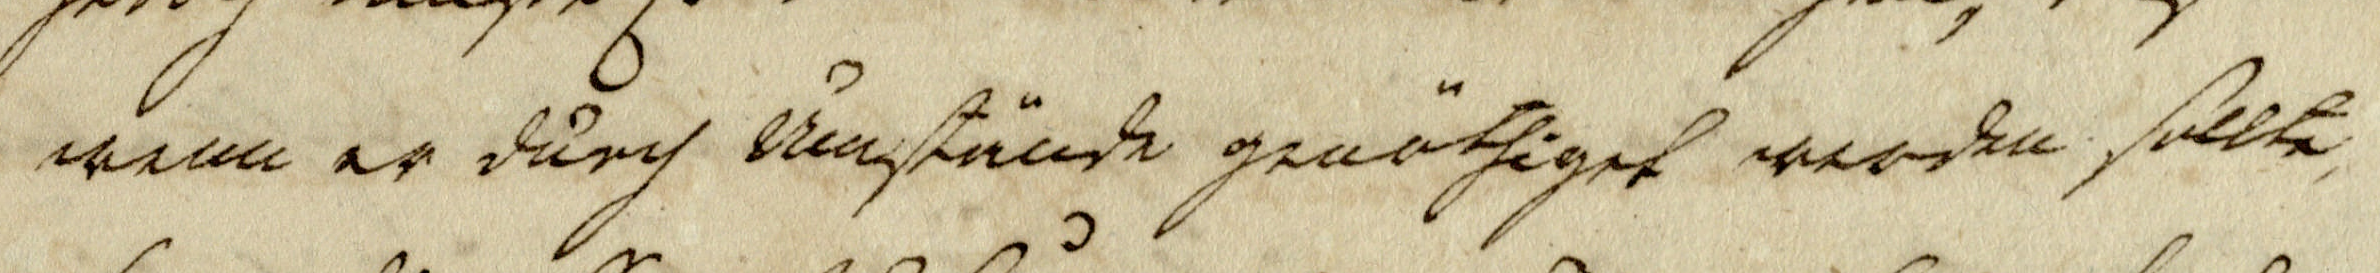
wenn er durch Umstände genöthiget werden sollte¬
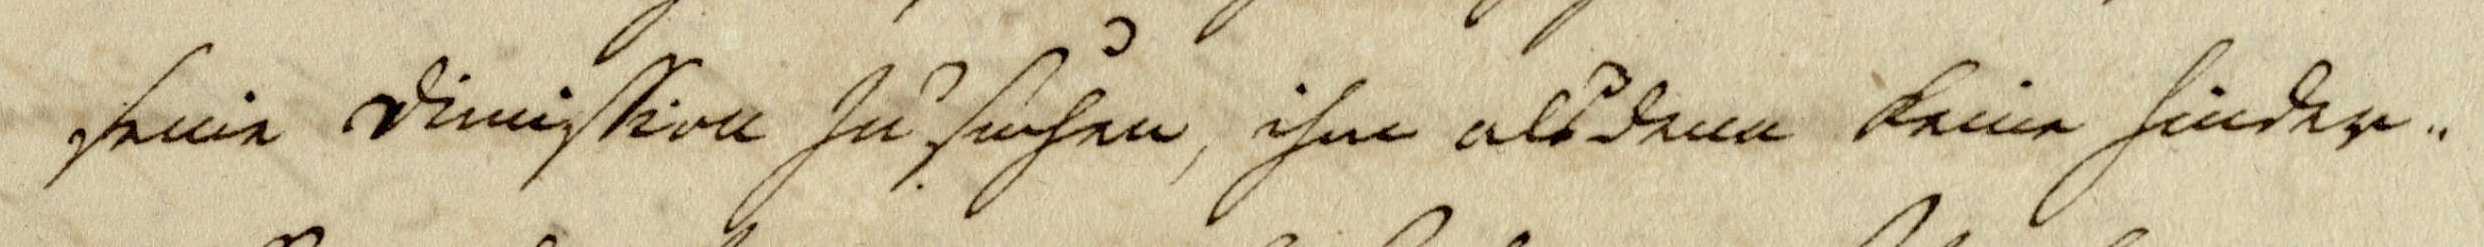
seine dimission zu suchen, ihm als denn keine Hinder¬
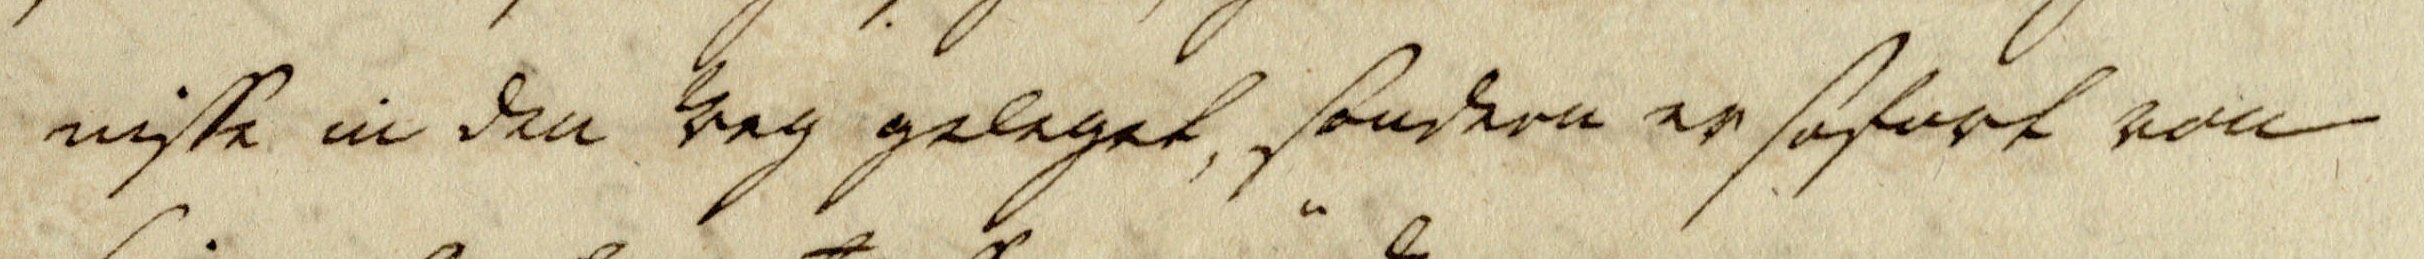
nisse in den Weg gelegt, sondern er sofort von
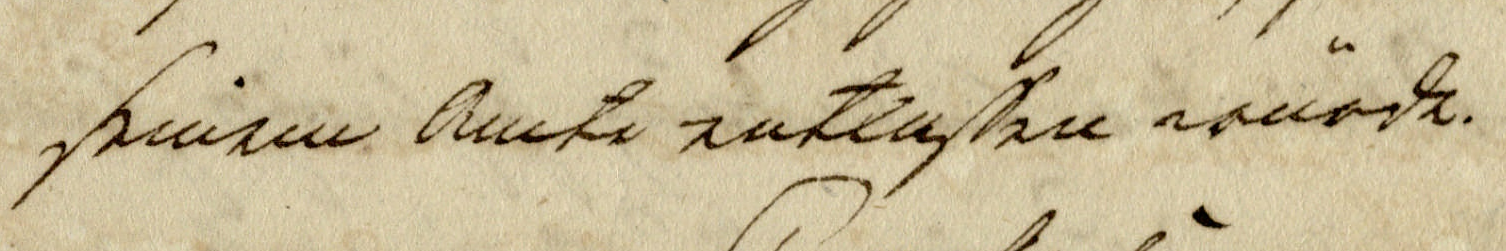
seinem Amte entlassen würde.
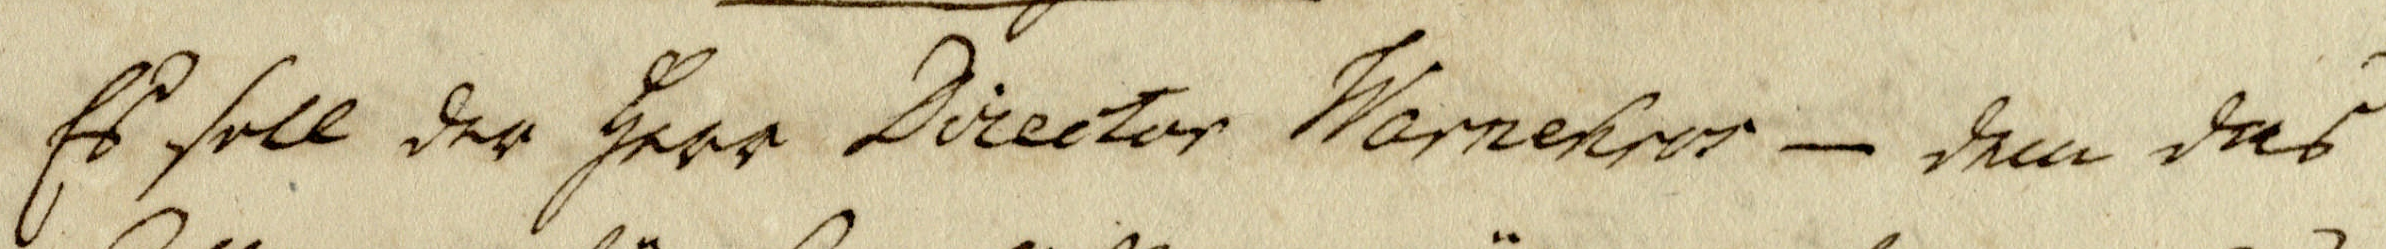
Es soll der Herr Director Warnekros dem das
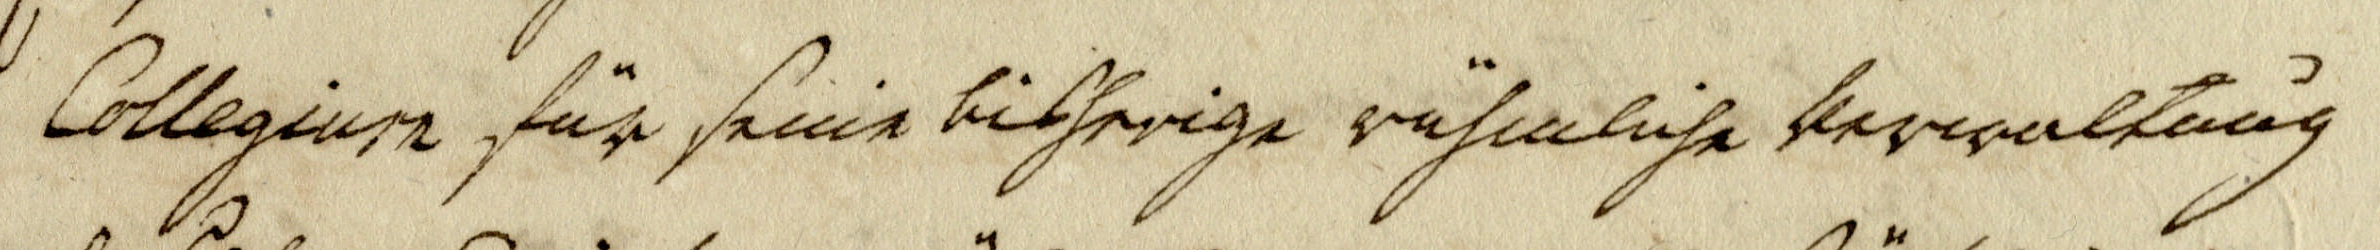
Collegium für seine bisherige rühmliche Verwaltung
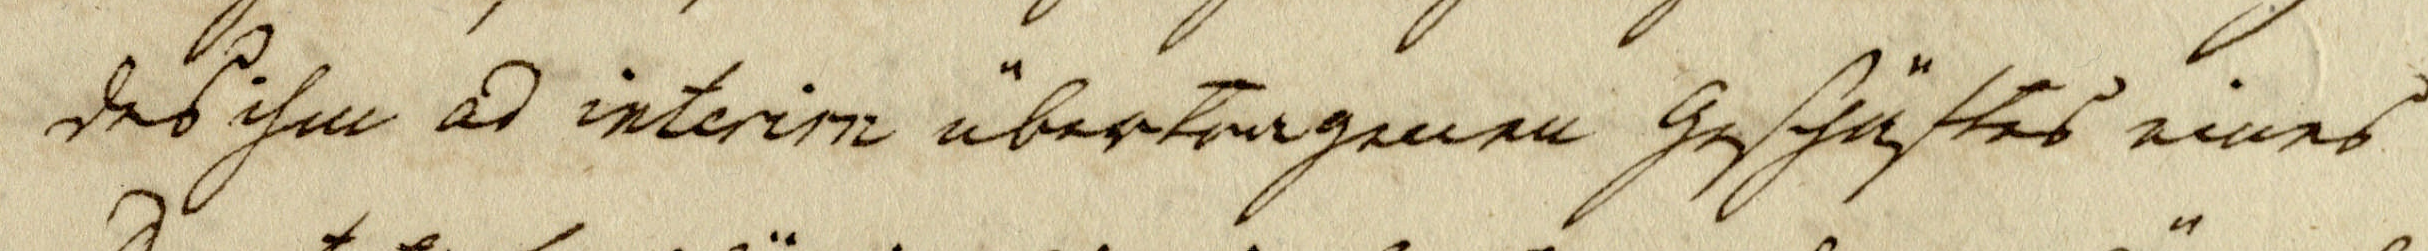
des ihm ad interim übertragenen Geschäftes eines
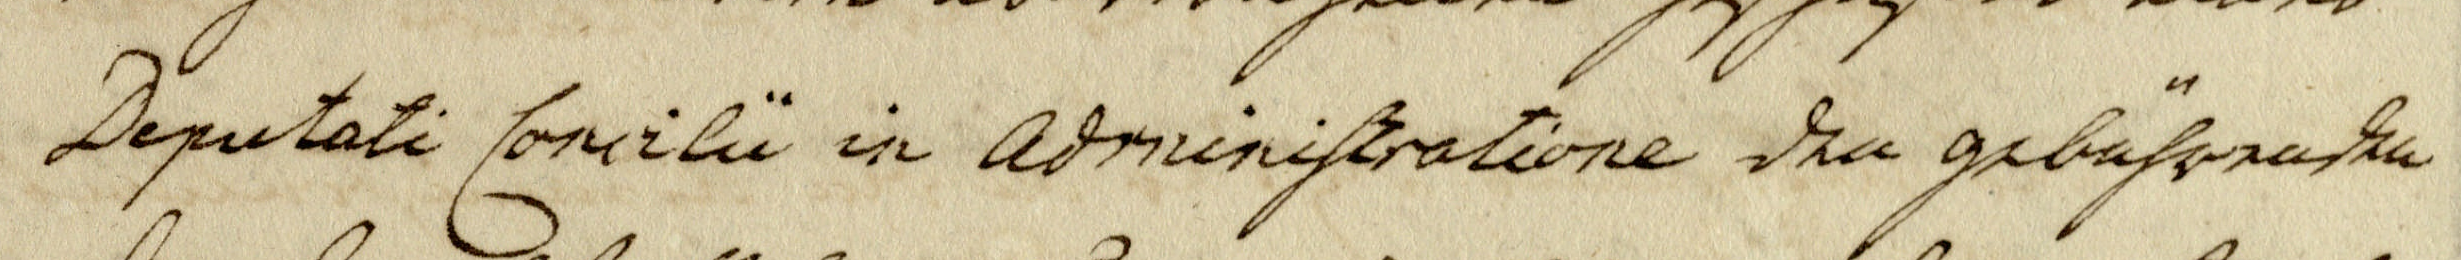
Deputati Concilii in Administration den gebührenden
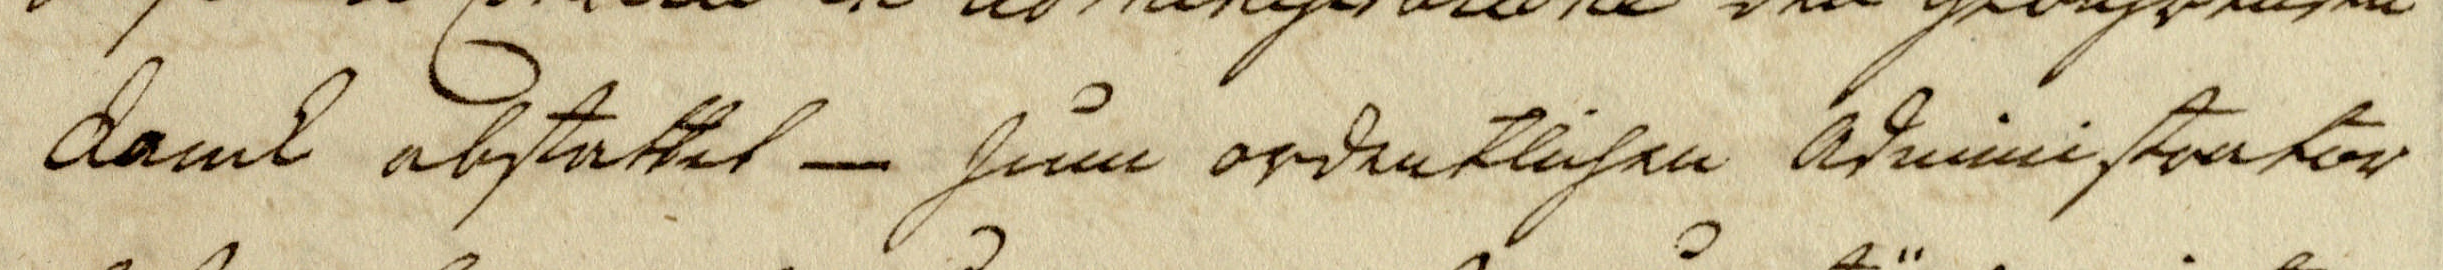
Danck abstattet zum ordentlichen Administrator
